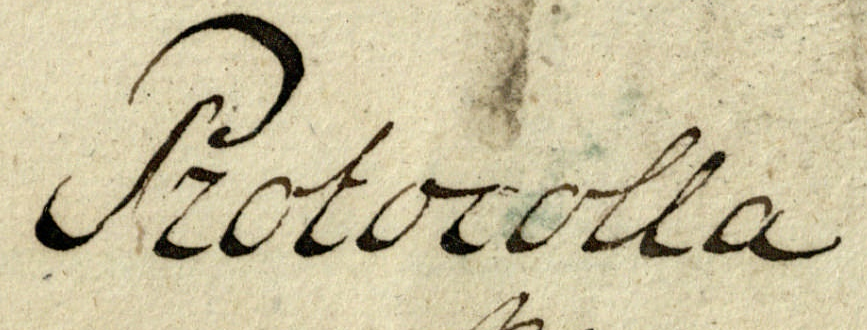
Protocolla
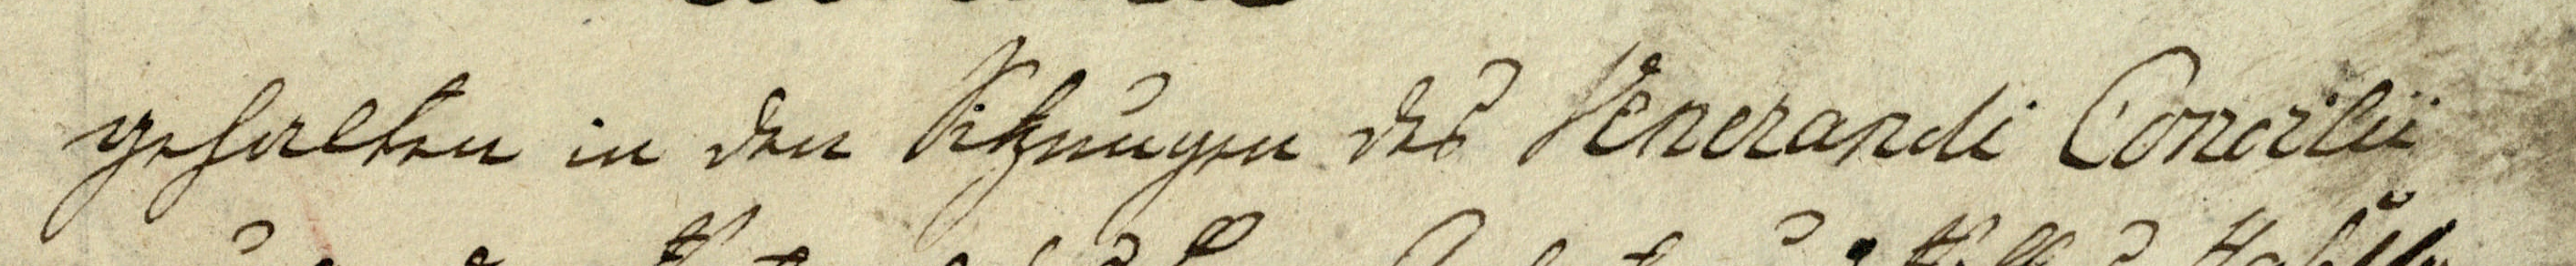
gehalten in den Sitzungen des Venerandi Concilii
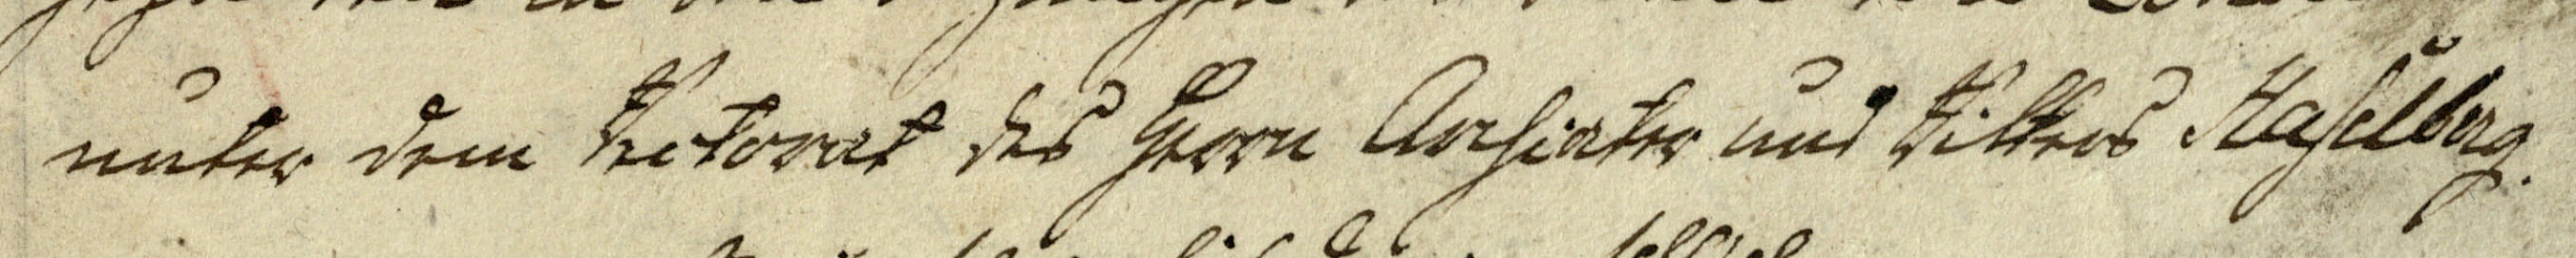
unter dem Rectorat des Herrn Archiater und Ritters Haselberg.
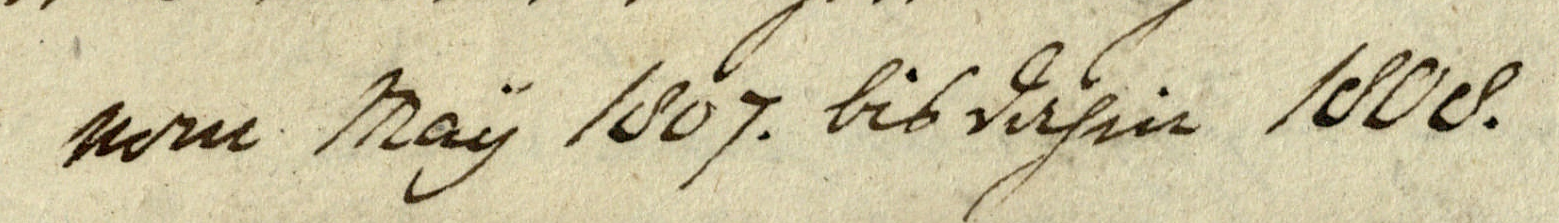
vom Maÿ 1807. bis dahin 1808.
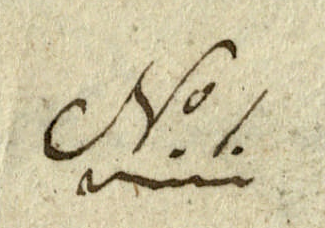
No 1.
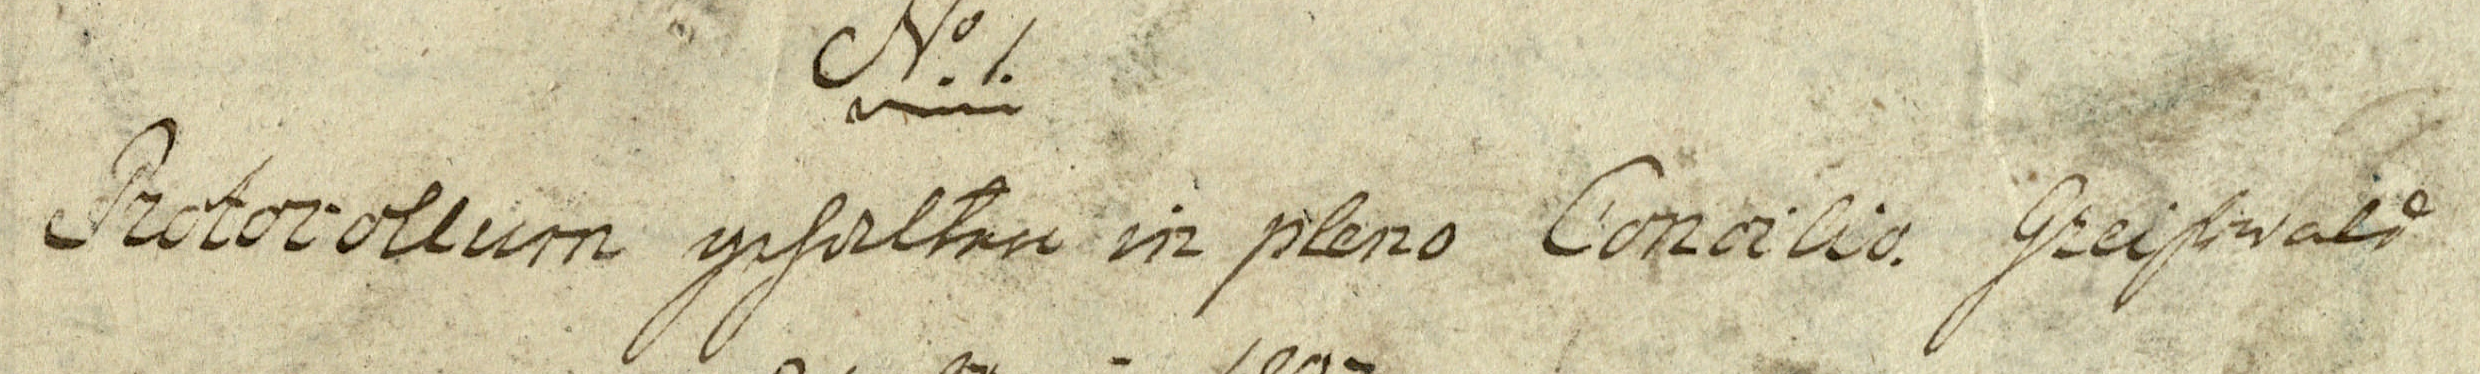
Protocollum gehalten in pleno Concilio Greifswald
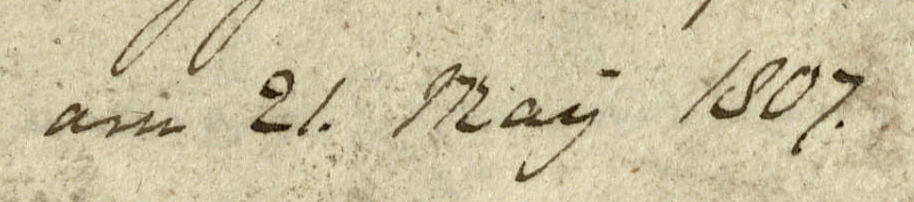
am 21. Maÿ 1807.
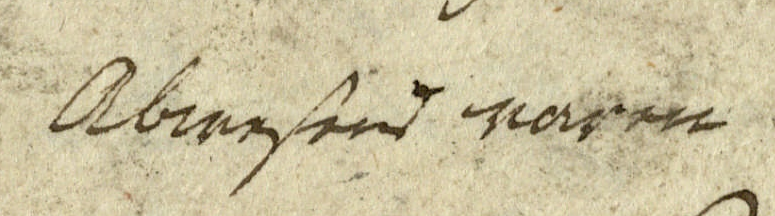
Abwesend waren
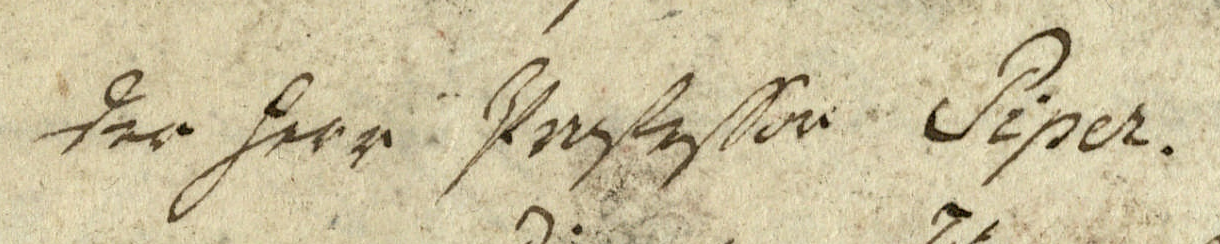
der Herr Professor Piper.
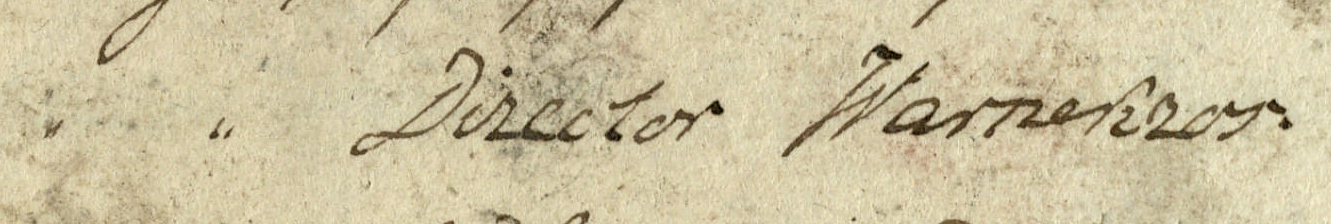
Director Warnekros.
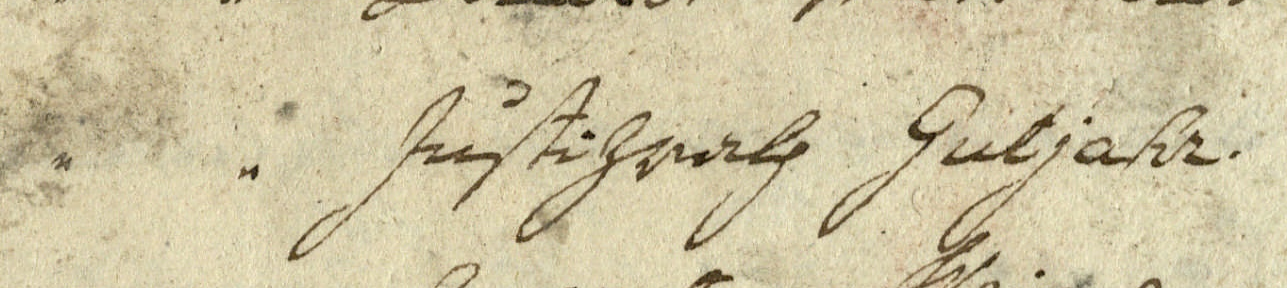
Justizrath Gutjahr.
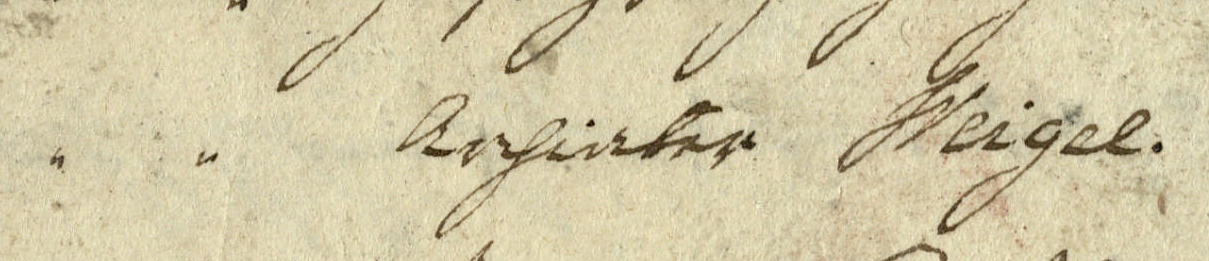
Archiater Weigel.
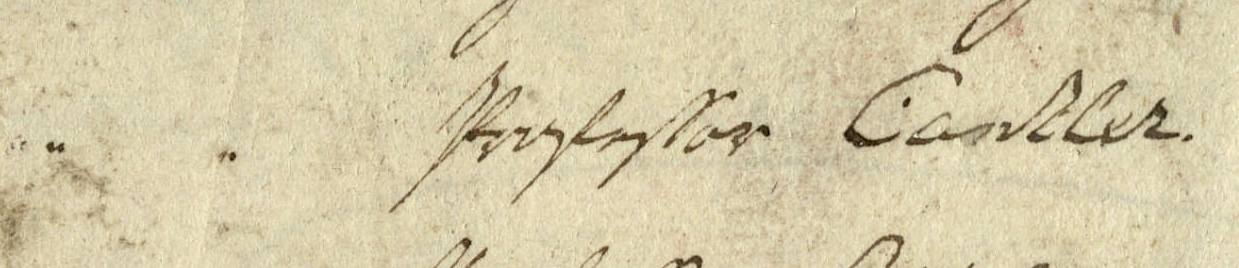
Professor Canzler.
